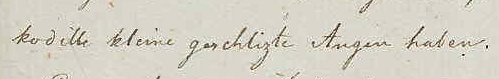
kodille kleine geschlizte Augen haben.
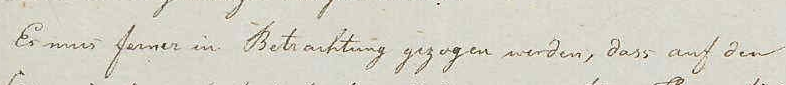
Es mus ferner in Betrachtung gezogen werden, dass auf den
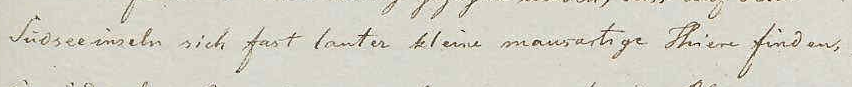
Südseeinseln sich fast lauter kleine mausartige Thiere finden,
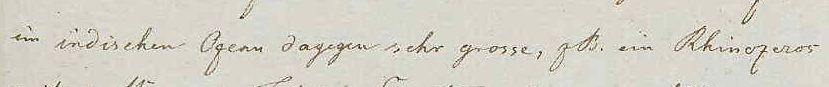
im indischen Ozean dagegen sehr grosse, zB. ein Rhinozeros
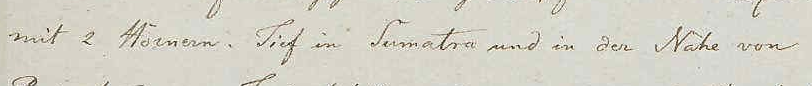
mit 2 Hörnern. Tief in Sumatra und in der Nähe von
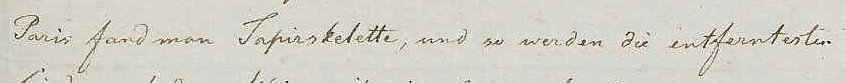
Paris fand man Tapirskelette, und so werden die entferntesten
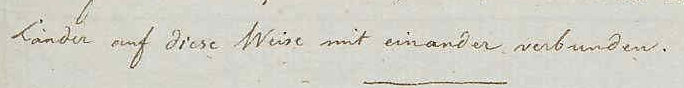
Länder auf diese Weise mit einander verbunden.
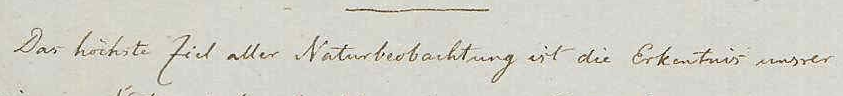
Das höchste Ziel aller Naturbeobachtung ist die Erkentnis unsrer
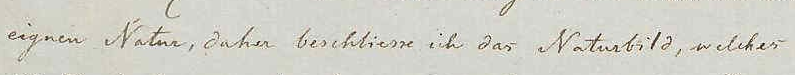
eignen Natur, daher beschliesse ich das Naturbild, welches
